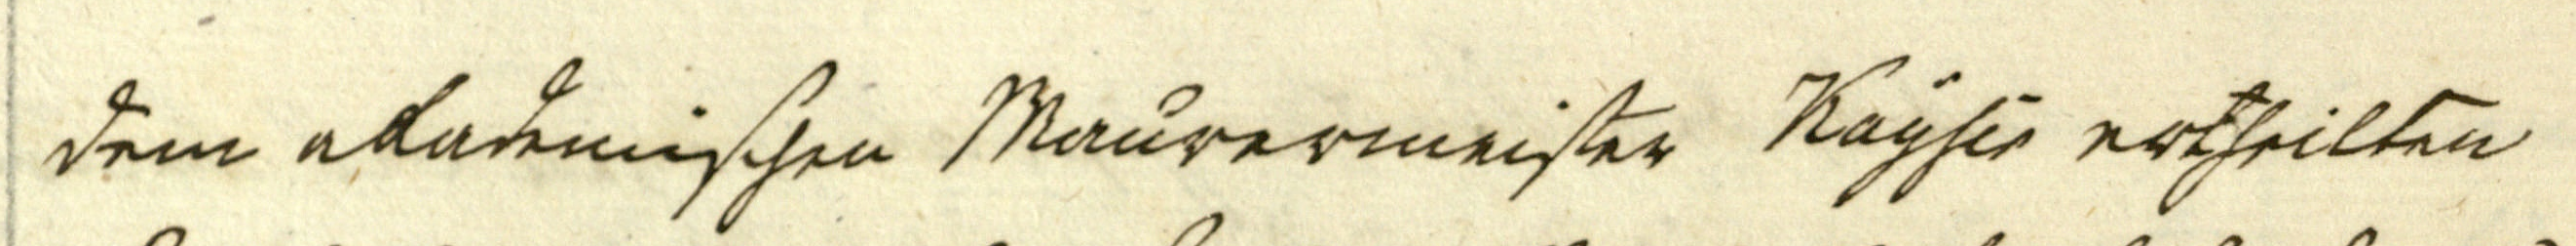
dem akademischen Maurermeister Kaÿser ertheilten
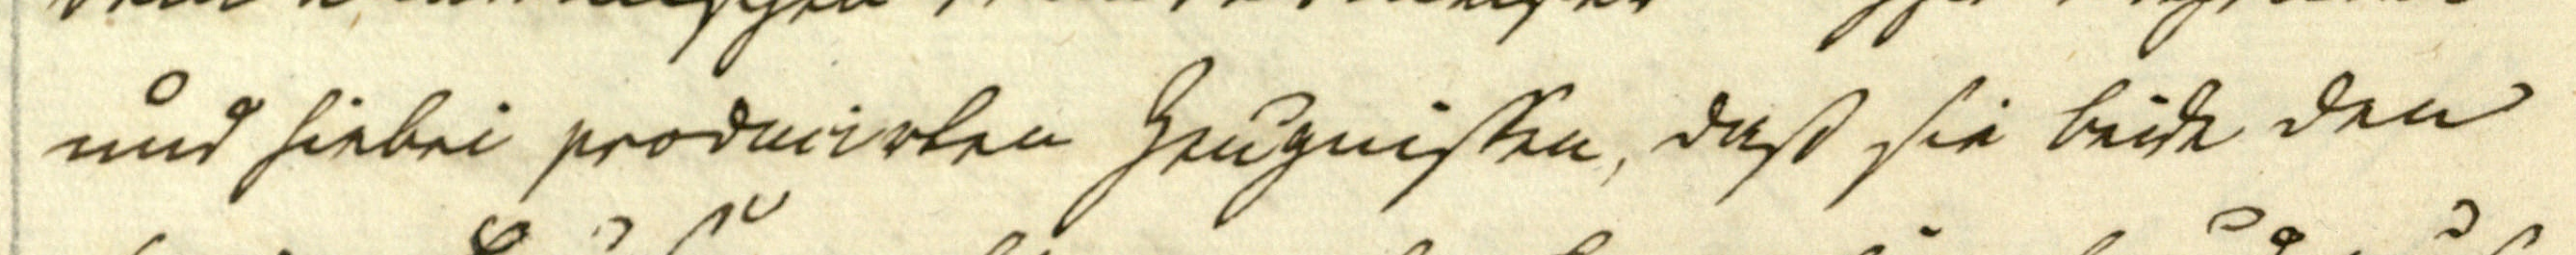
und hiebei producirten Zeugnissen, daß sie beide den
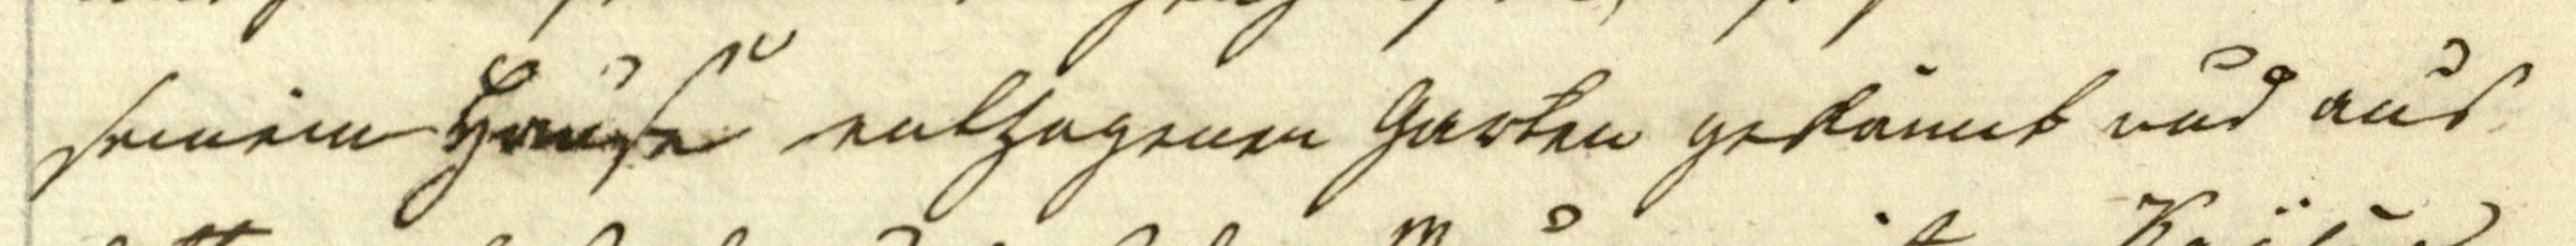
seinem Hause entzogenen Garten gekannt und aus
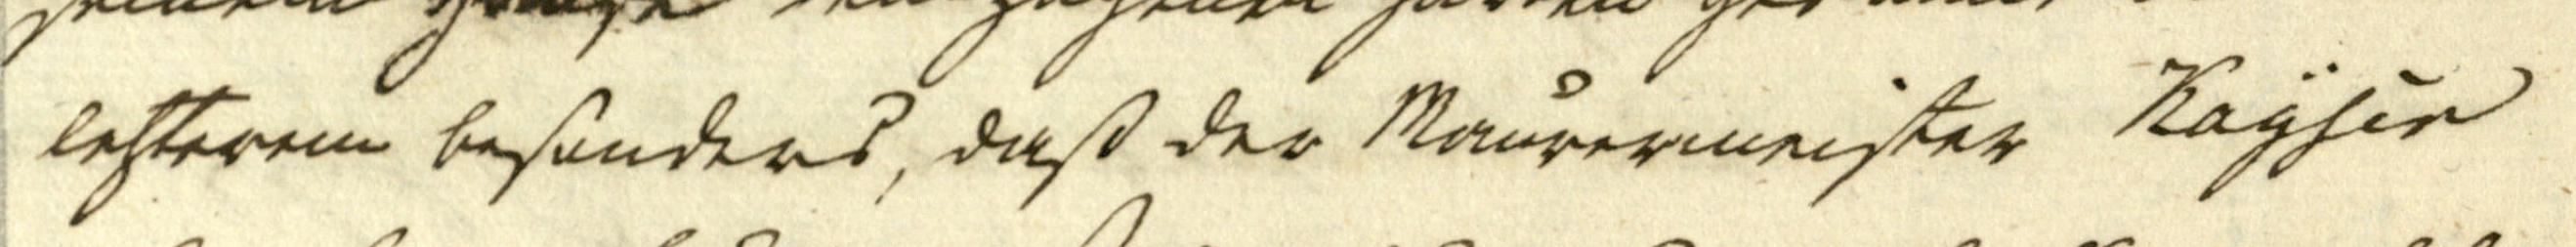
letzterem besonders, daß der Maurermeister Kaÿser
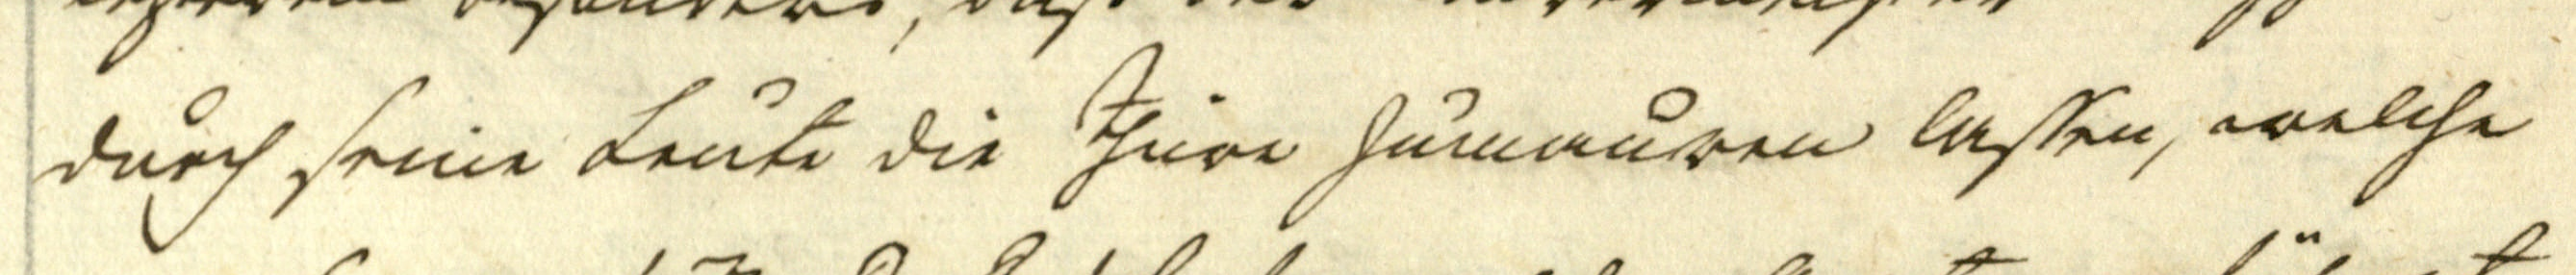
durch seine Leute die Thüre zumauren lassen, welche
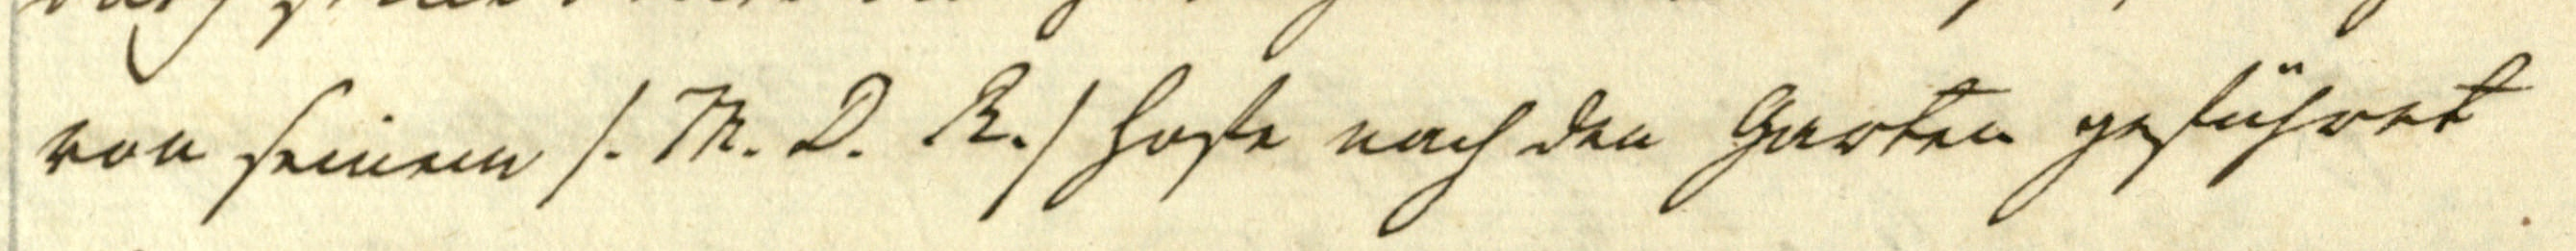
von seinem /. M. D. R./ Hofe nach den Garten geführet
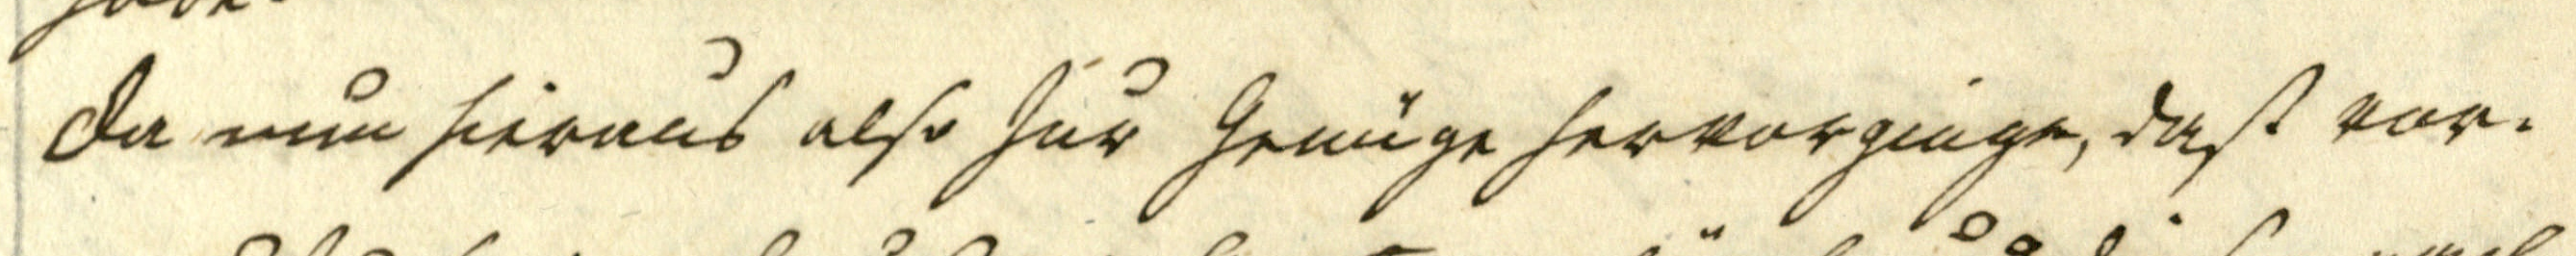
Da nun hieraus also zur Genüge hervorginge, daß vor¬
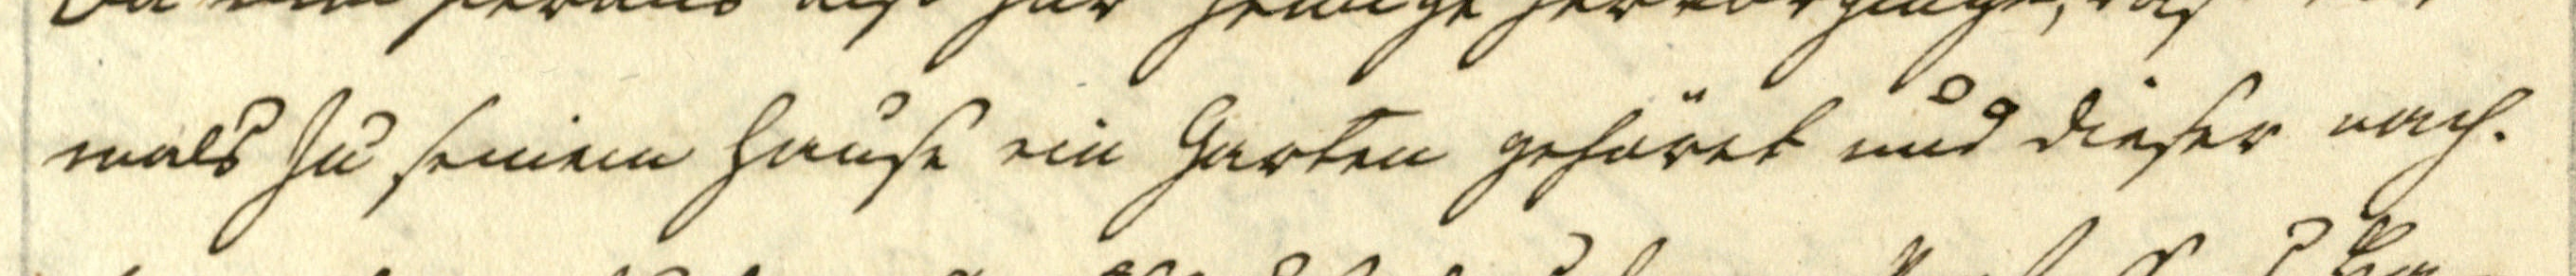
mals zu seinem Hause ein Garten gehöret und dieser nach¬
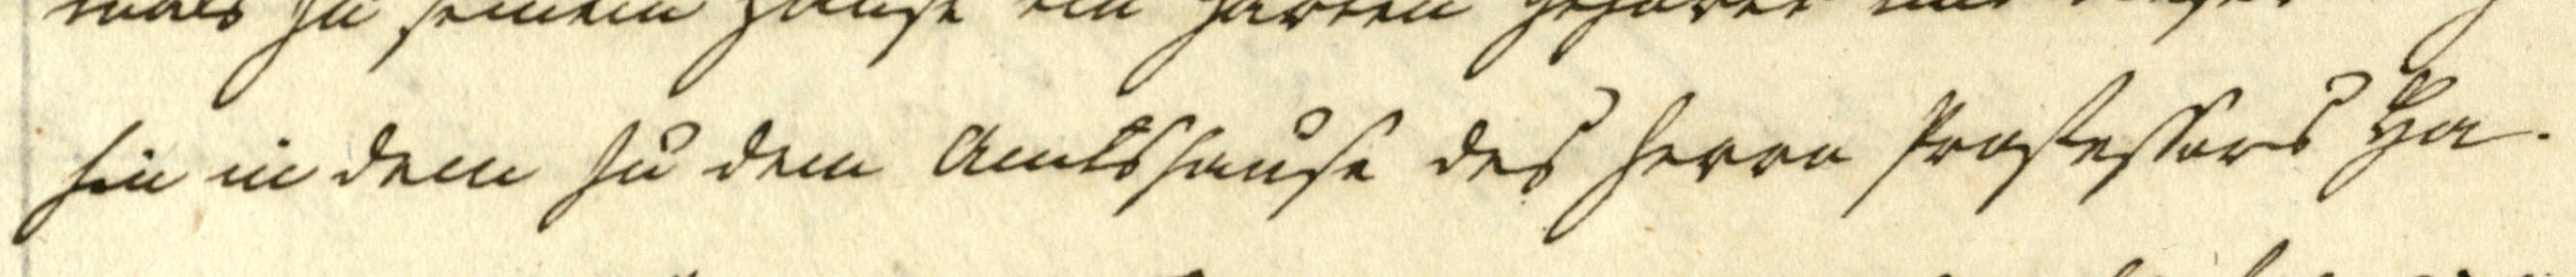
hin in dem zu dem Amtshause des Herrn Professors Ha-
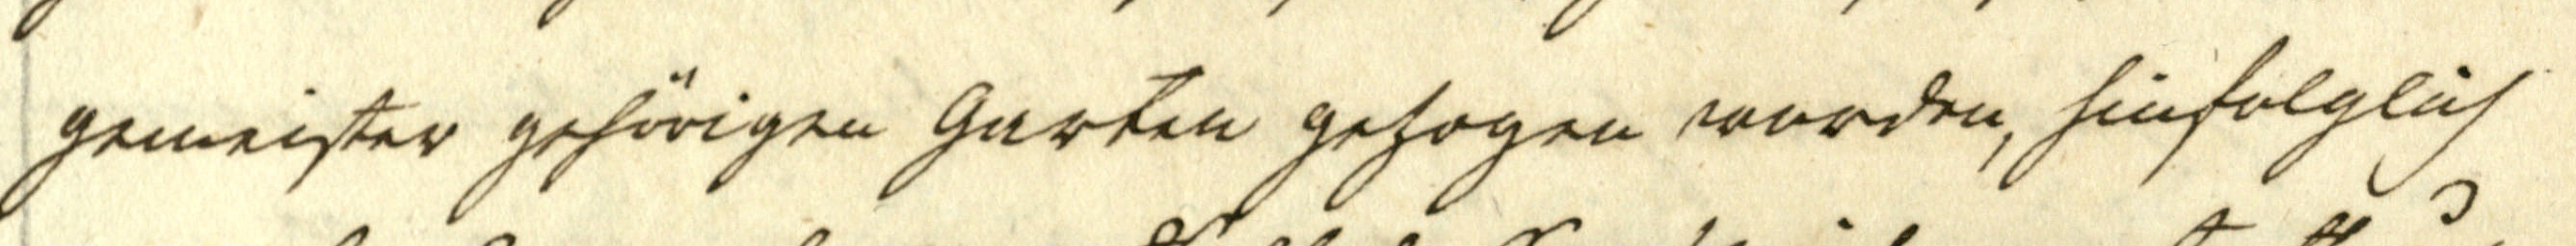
gemeister gehörigen Garten gezogen worden, hinfolglich
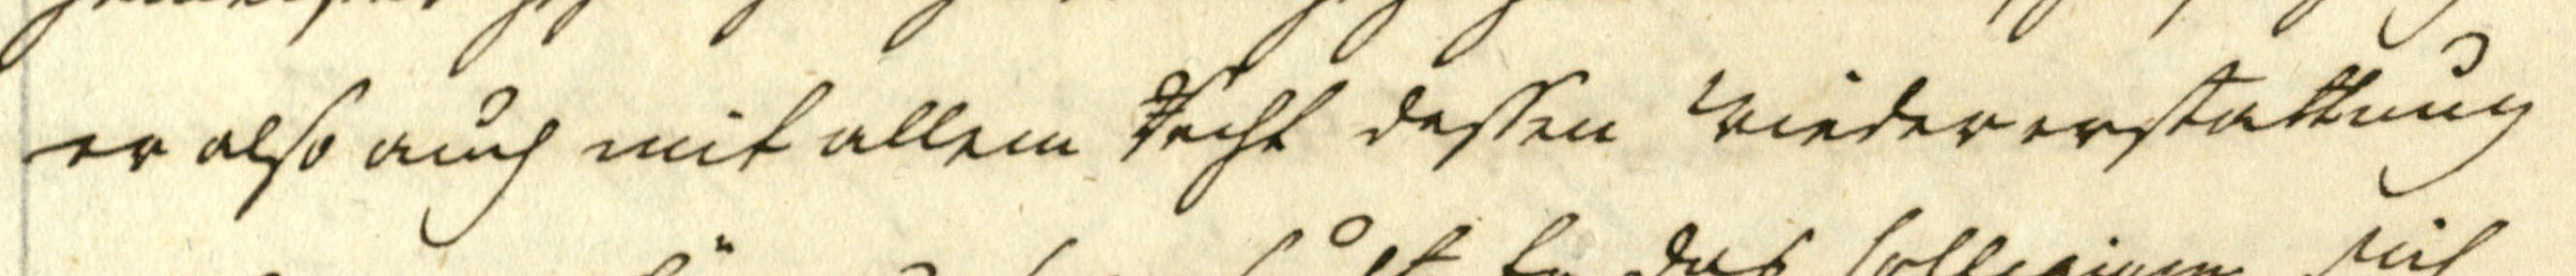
er also auch mit allem Recht dessen Wiedererstattung
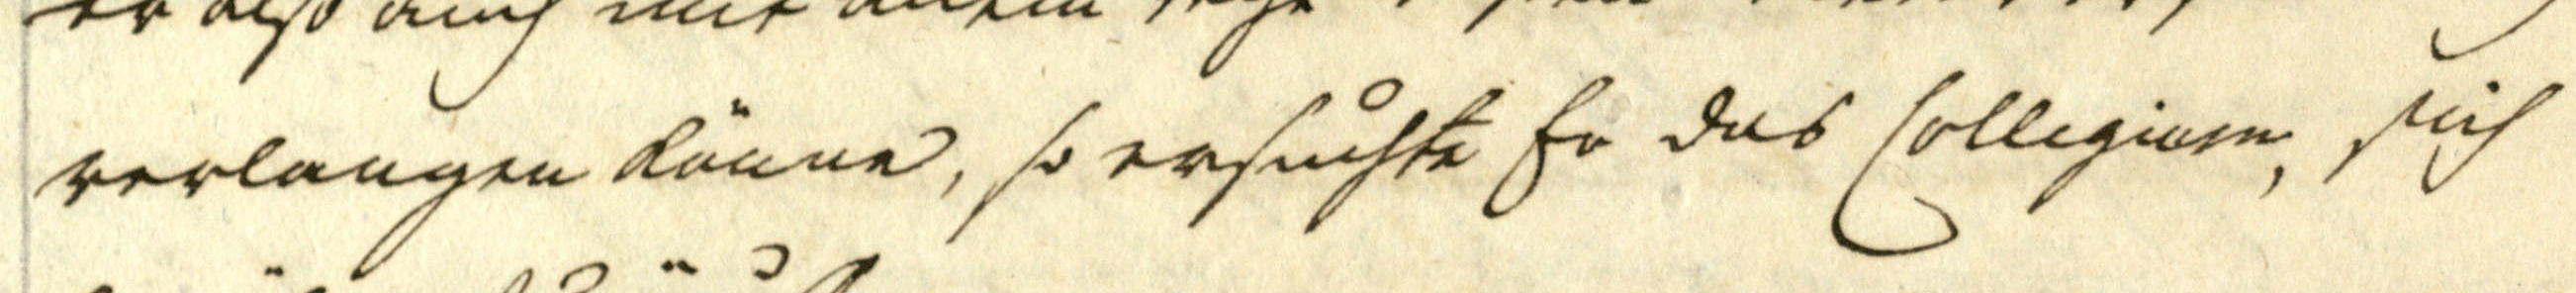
verlangen könne, so ersuchte Er das Collegium, sich
